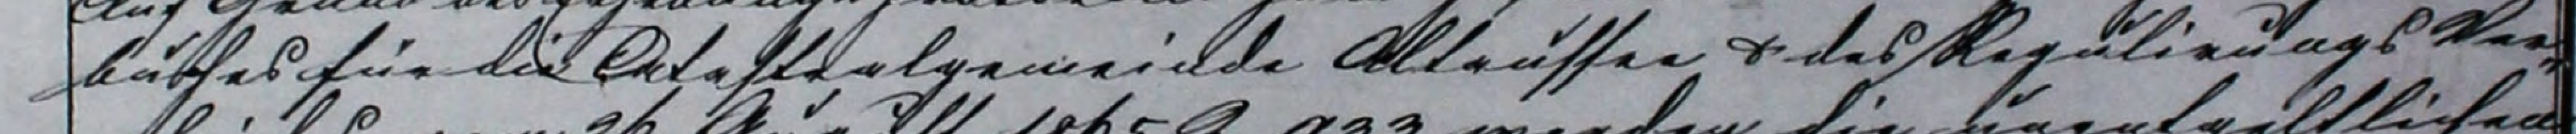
buches für die Katastralgemeinde Altaussee & des Regulirungs Ver„
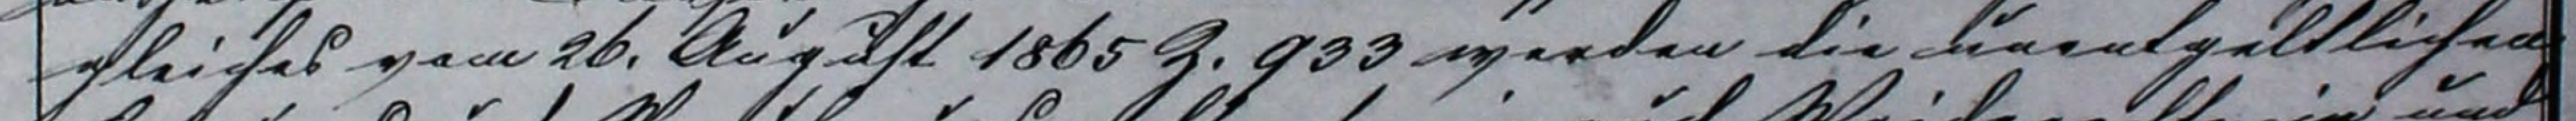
gleiches vom 26. August 1865 Z. 933 werden die unentgeltlichen
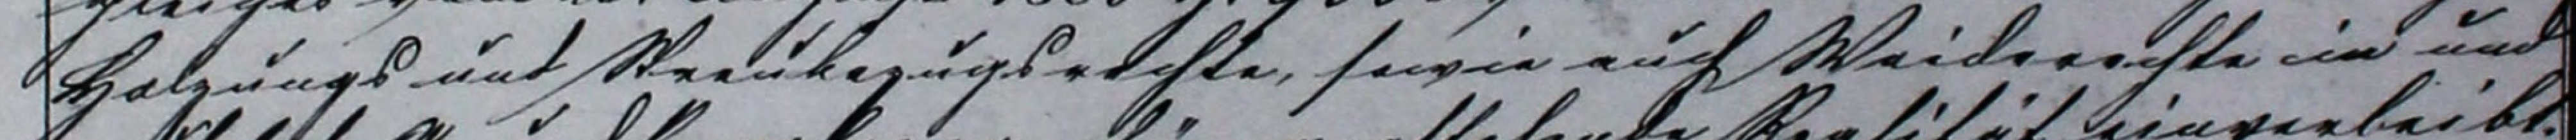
Holzungs und Streubezugsrechte, sowie auch Weiderechte in und
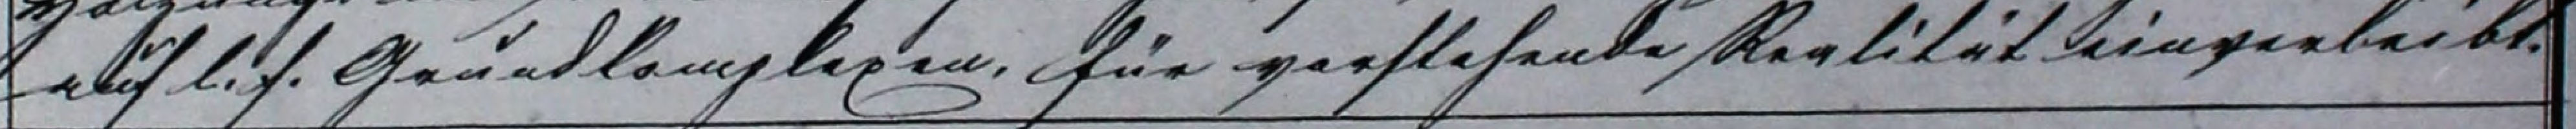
auf lf. Grundkomplexen, für vorstehende Realität einverleibt.
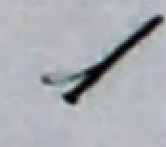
1
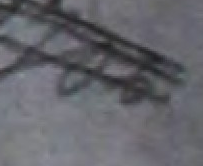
??7
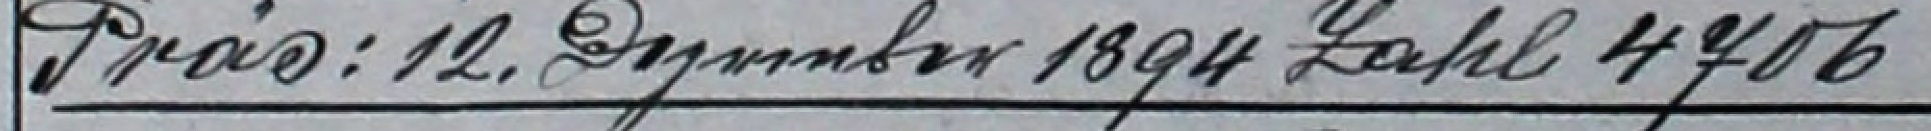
Präs: 12. Dezember 1894 Zahl 4706
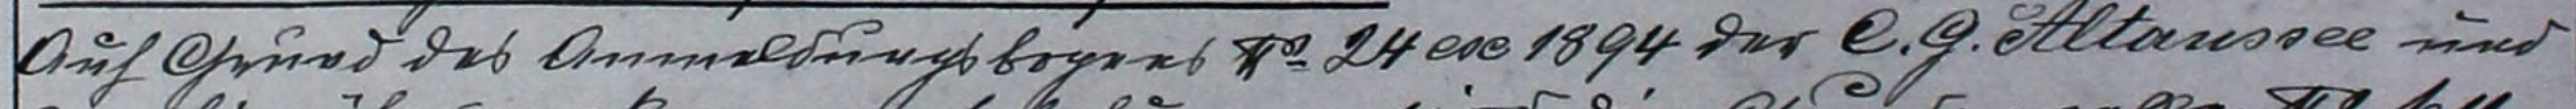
Auf Grund des Anmeldungsbogens No 24 000 1894 der C.G. Altaussee und
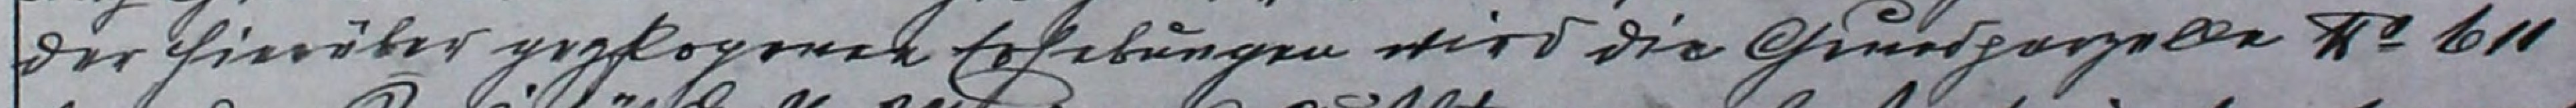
der hierüber perzkopenen Erhebungen wird die Grundparzelle No 611
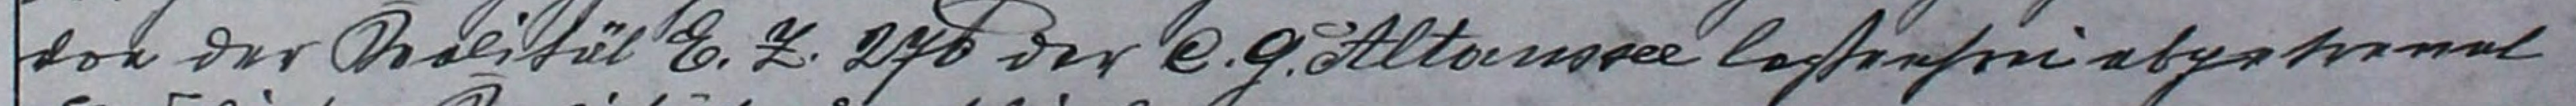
von der Realität E.Z. 270 der C.G. Altaussee lastenfrei abgetrennt
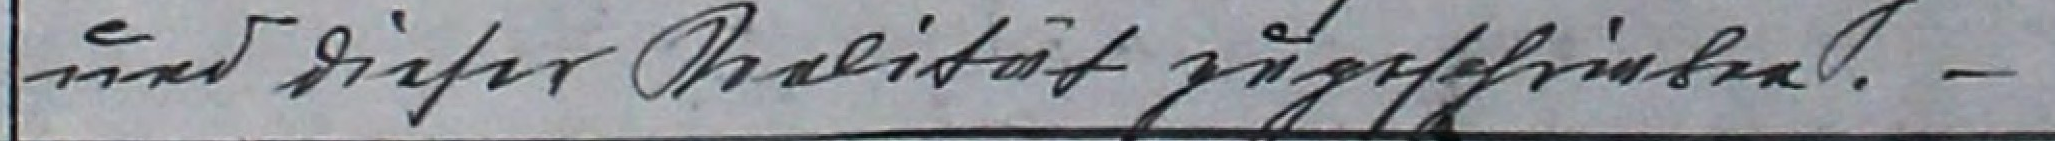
und dieser Realität zugsschrieben. -
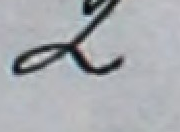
2
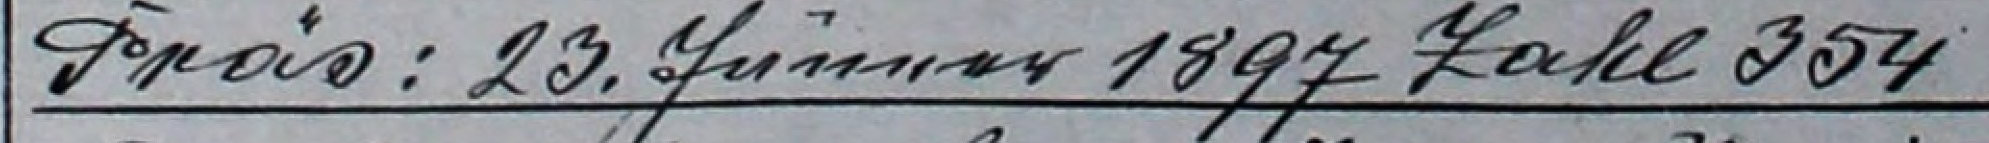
Präs: 23. Jänner 1897 Zahl 354
